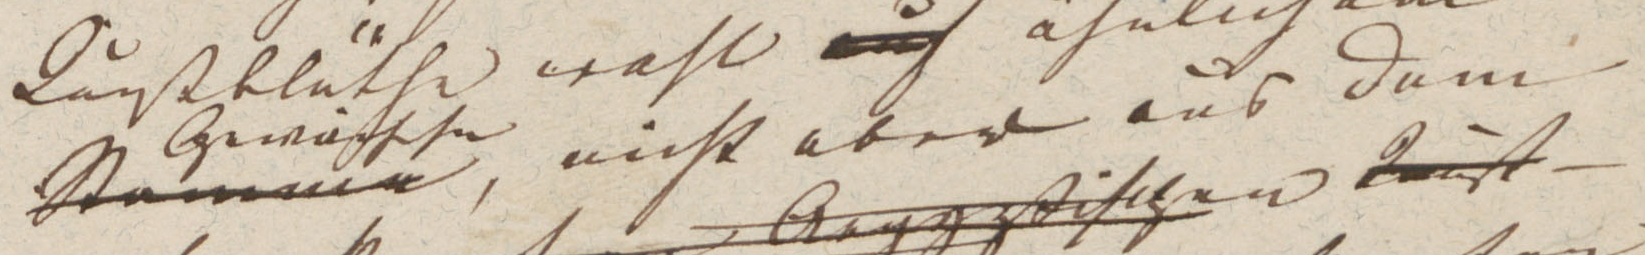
Stamme Gewächse, nicht aber aus dem
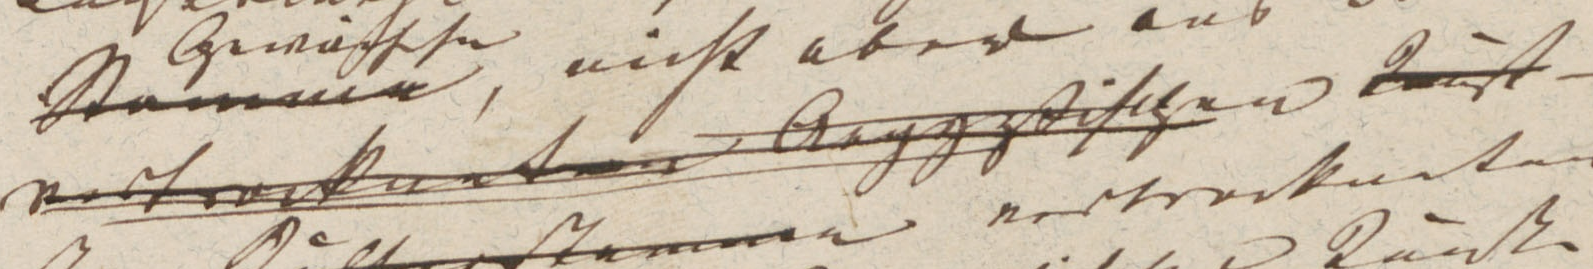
vertrockneten Aegyptischen Künst-
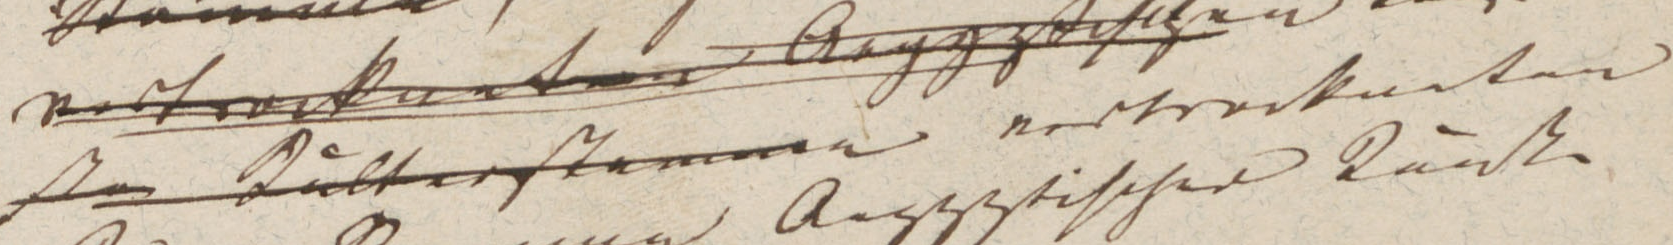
ste Kulturstemma vertrockneten
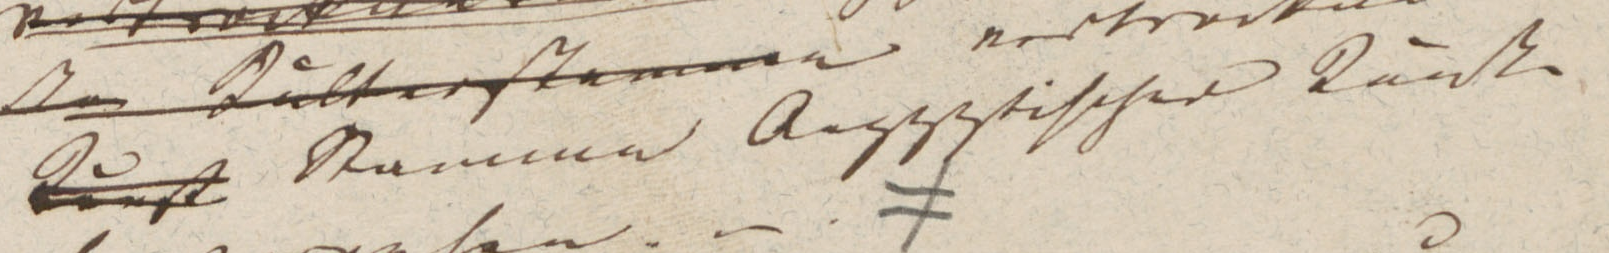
Kunst Stamme Aegyptischer Kunst
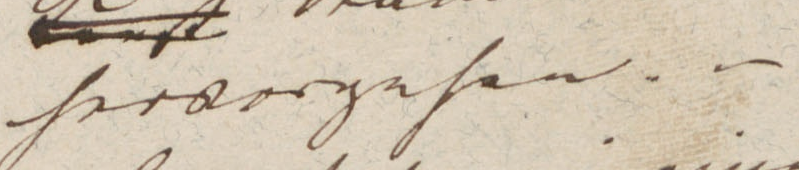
hervorgehen. – . %
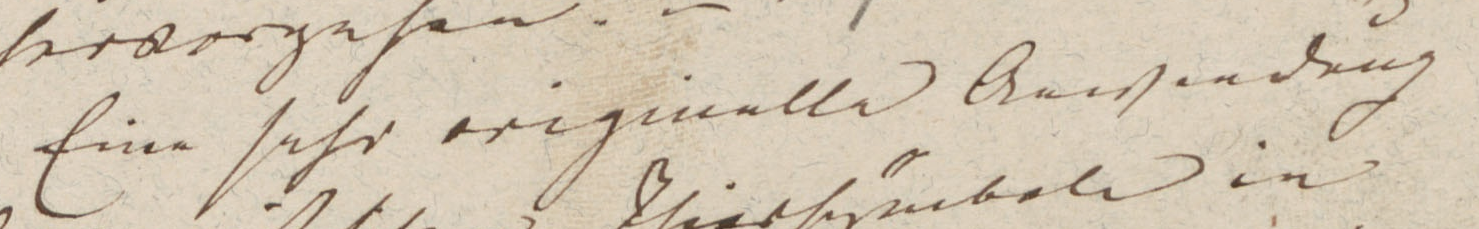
Eine sehr originelle Anwendung
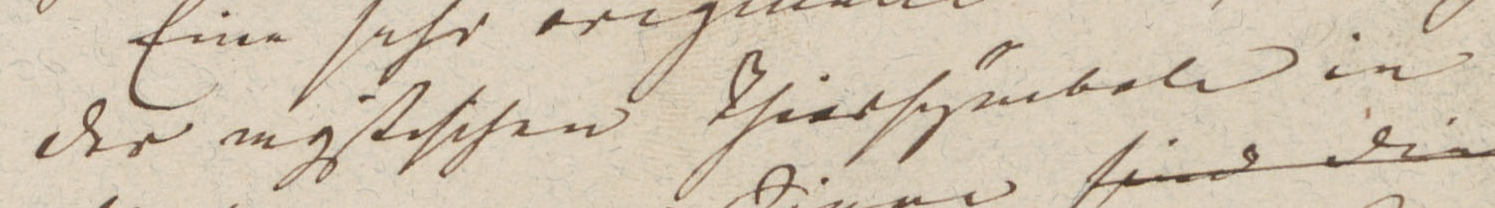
der mystischen Thiersymbole in
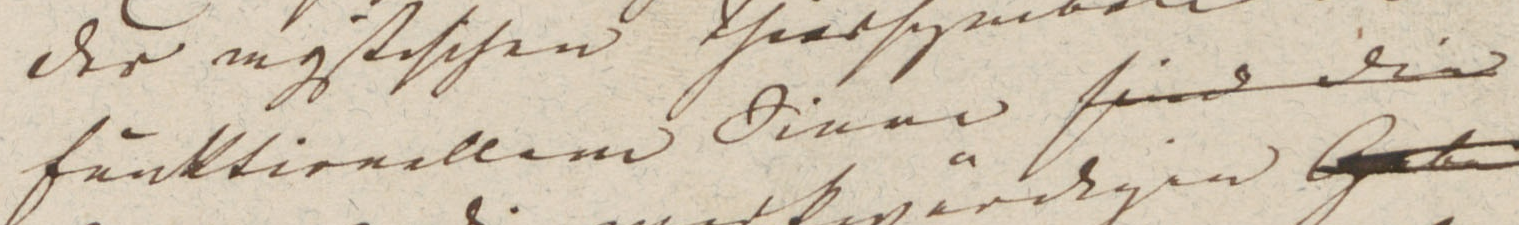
funktionellem Sinne sind die
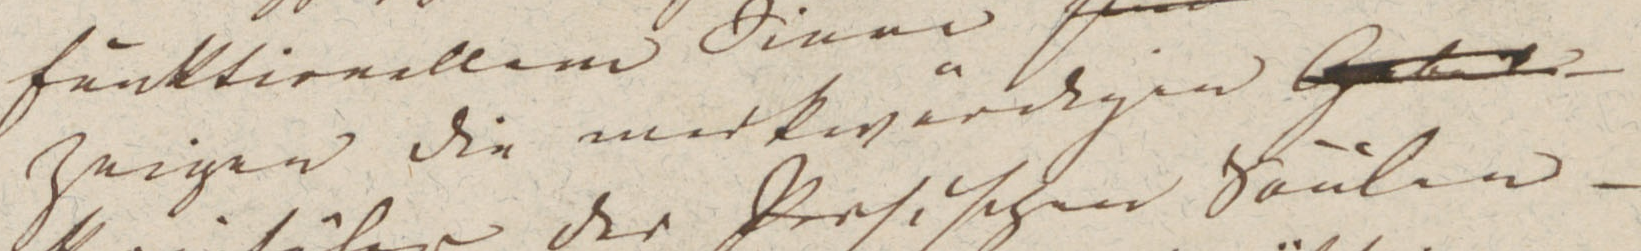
zeigen die merkwürdigen Gabel-
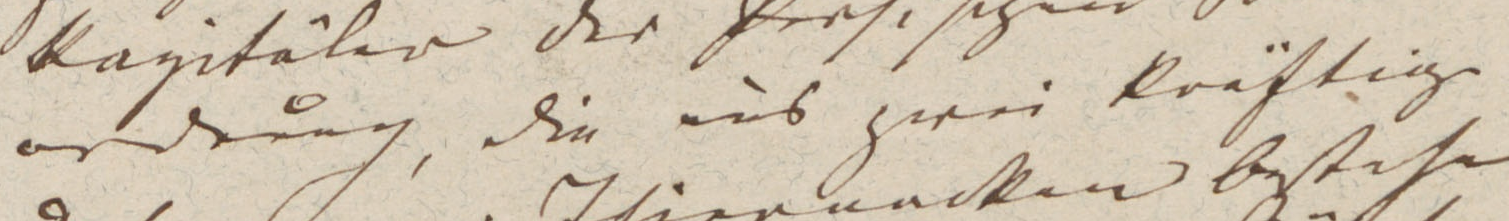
odnung, die aus zwei kräftig
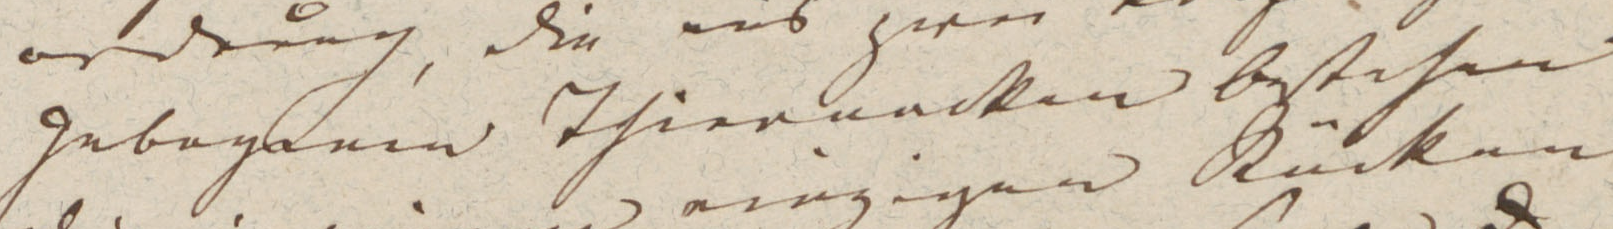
gebogenen Thiernacken bestehen
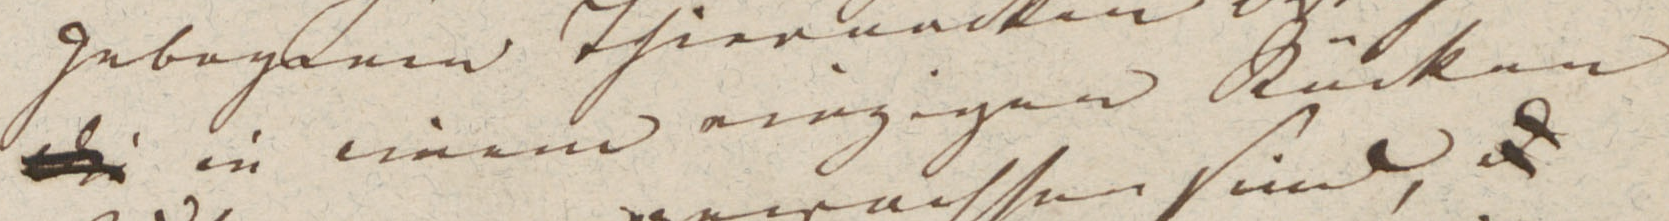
die in einem einzigen Rücken
